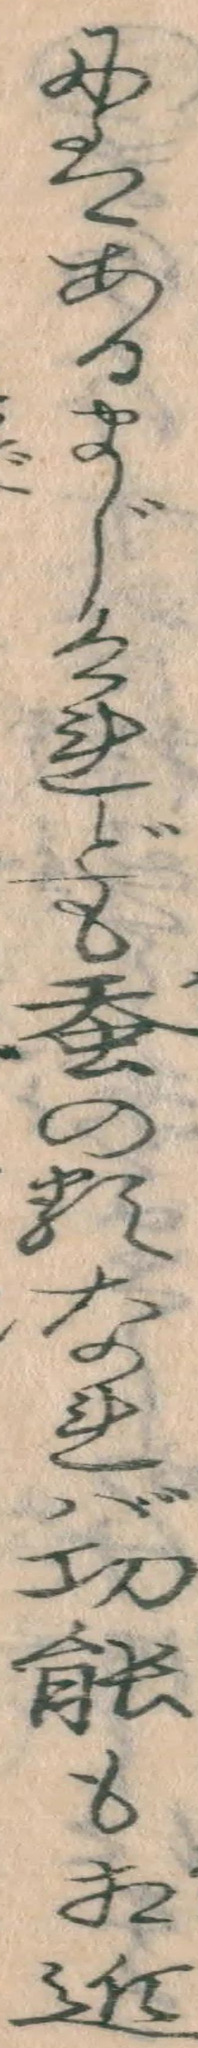にはあるまじけれども蚕の類なれば功能も相近
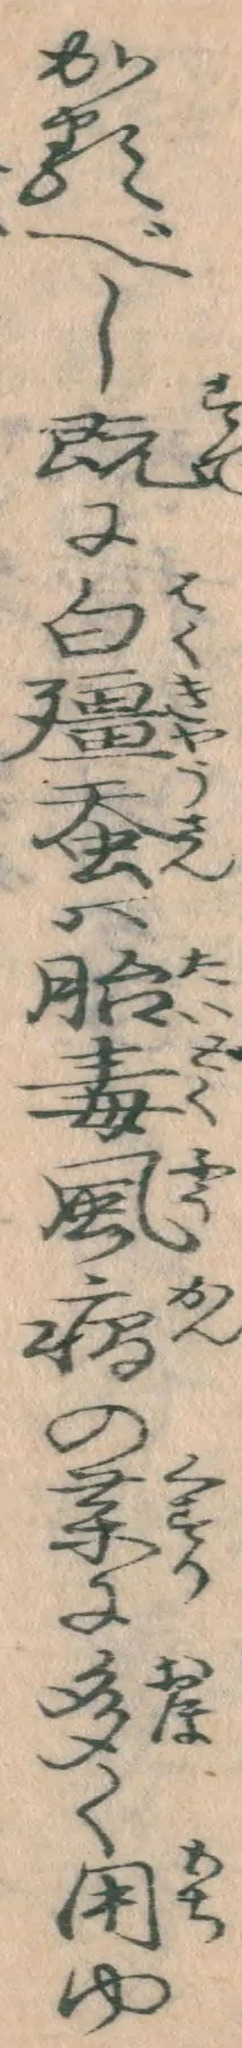かるべし既に白殭蚕は胎毒風癇の薬に多く用ゆ
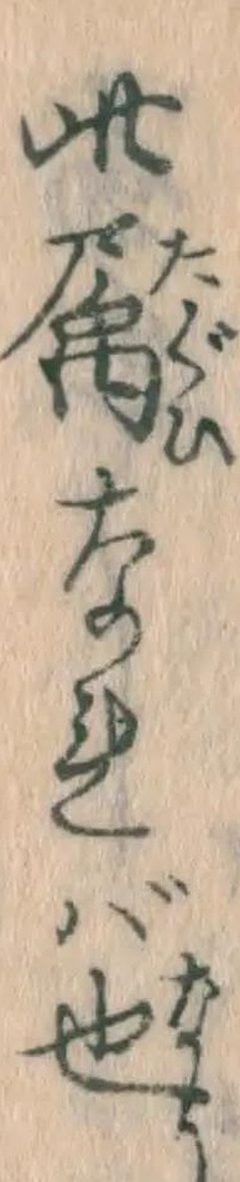此属なれば也
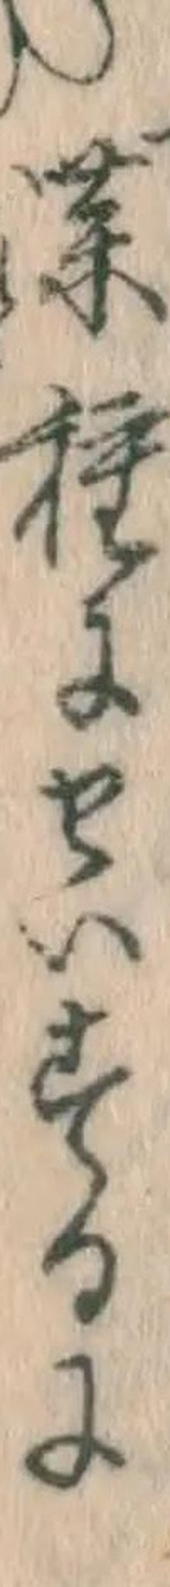薬種にせいするに
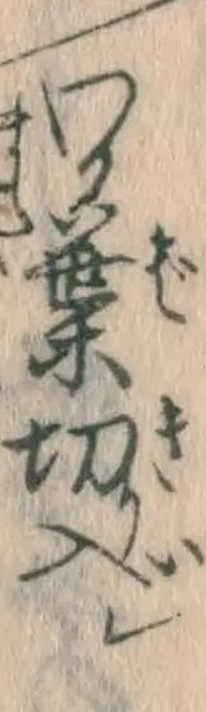わか葉切り入れ
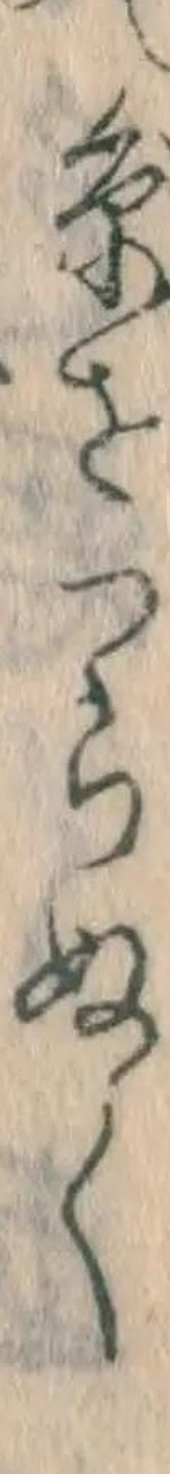糸をつらぬく
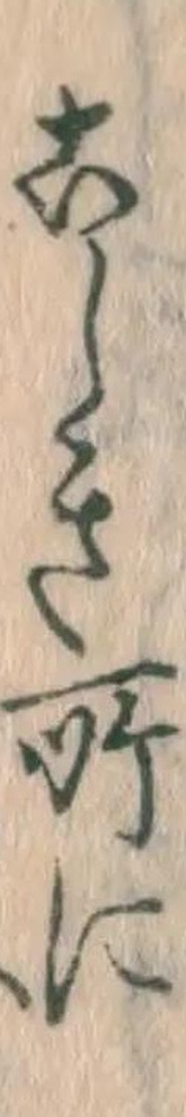こしき所に
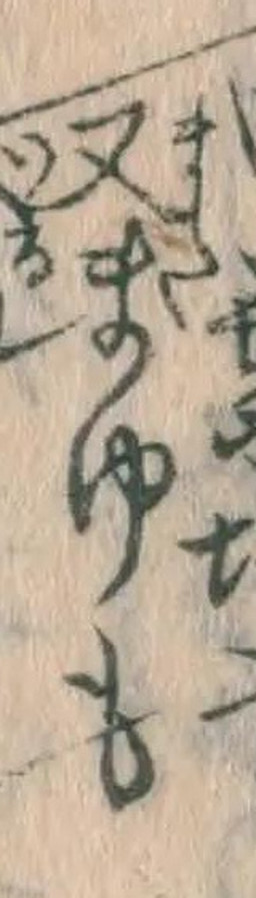又まゆも
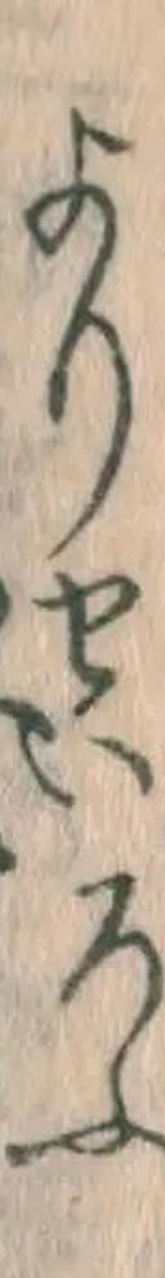よりせいろふ
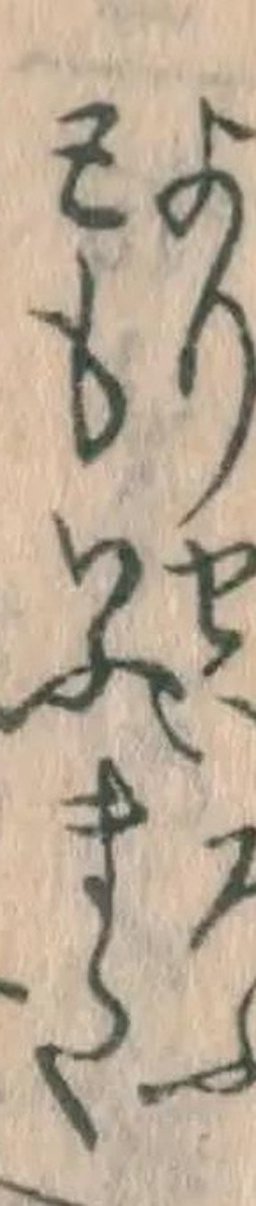ともいふまた
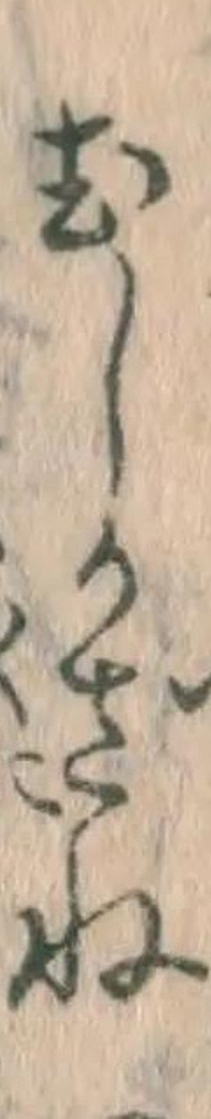むしかさね
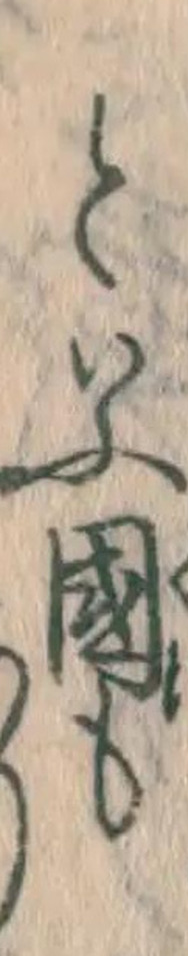といふ国も
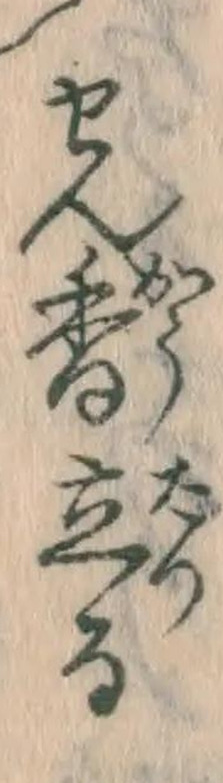せん香立る
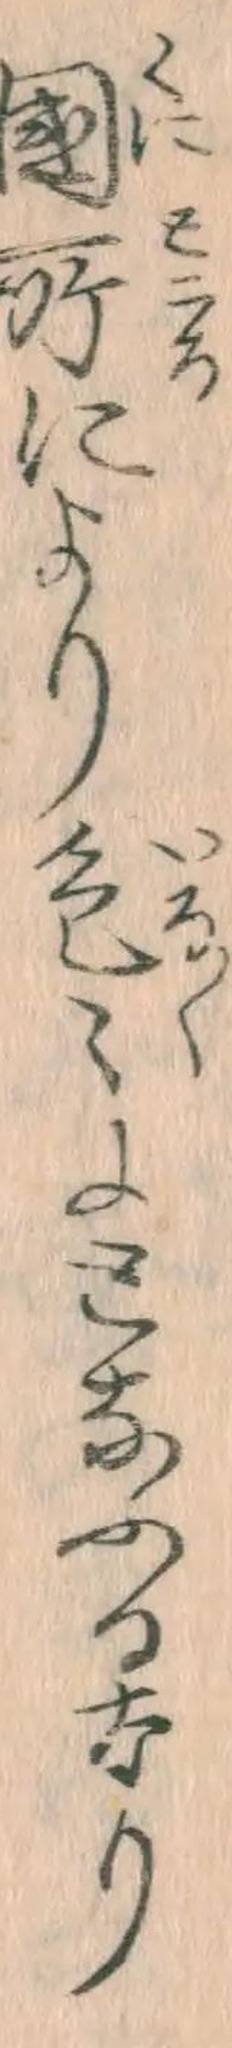国所により色々にとなふるなり
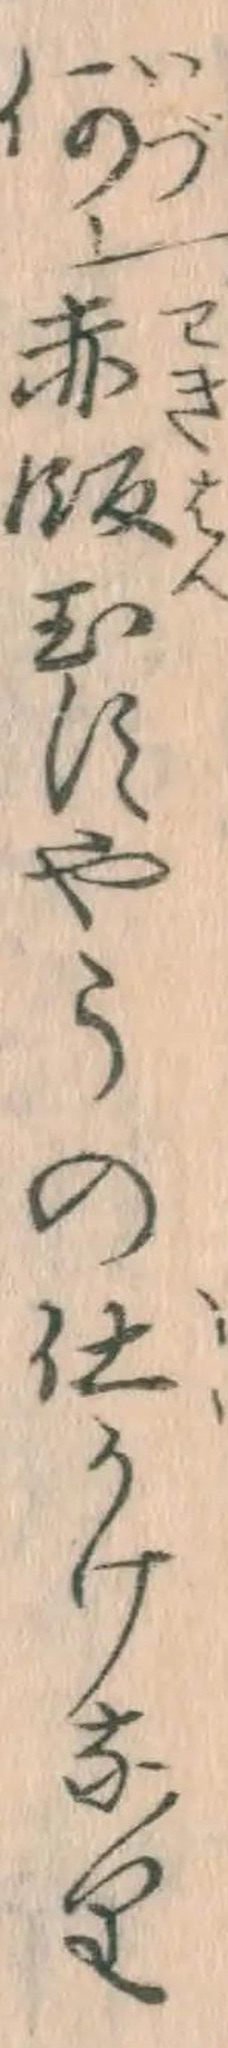何れ赤飯むすやうの仕かけなり
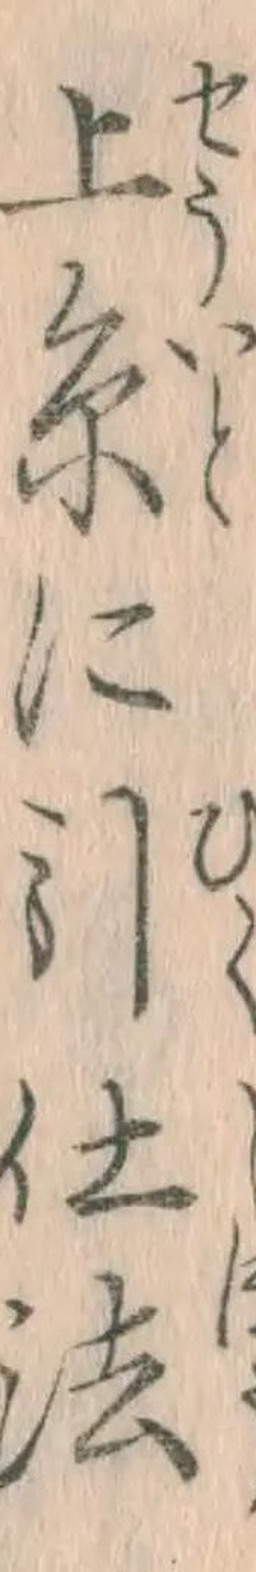上糸に引仕法
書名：山繭養法秘傳抄
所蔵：国立国会図書館 National Diet Library, JAPAN
